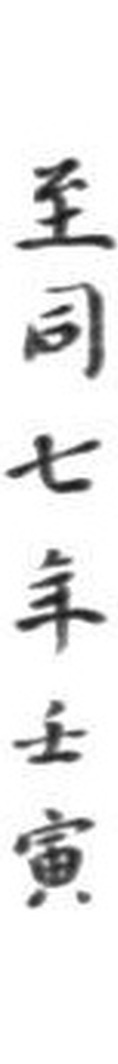至同七年壬寅

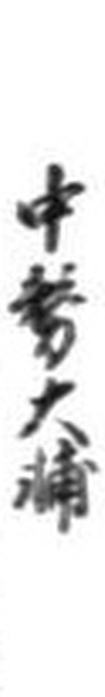中務大輔
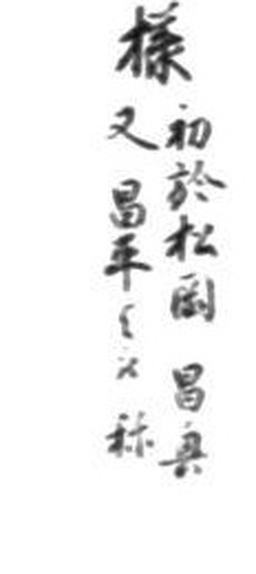又昌平与被称
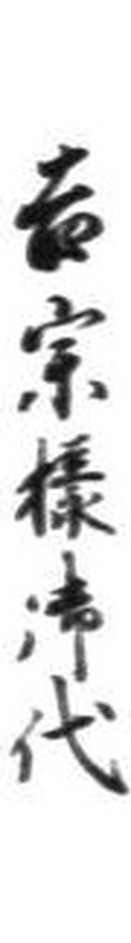吉宗様御代
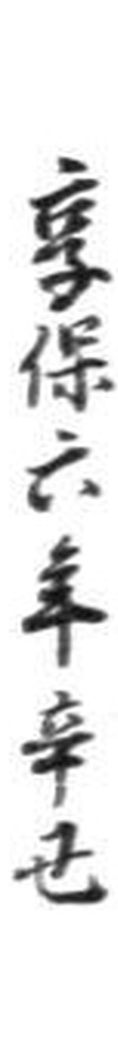享保六年辛丑
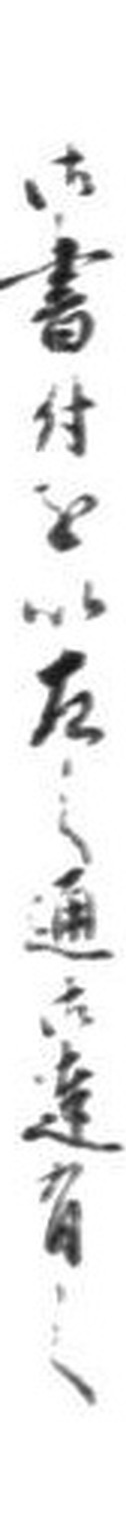御書付を以左之通御達有之

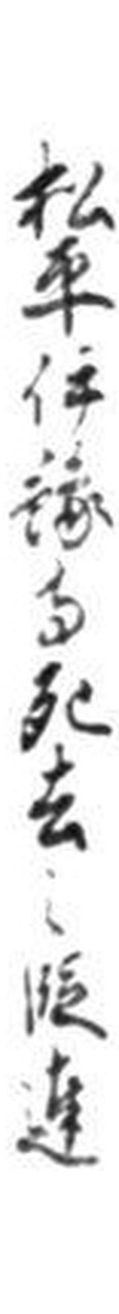松平伊予守死去之段達
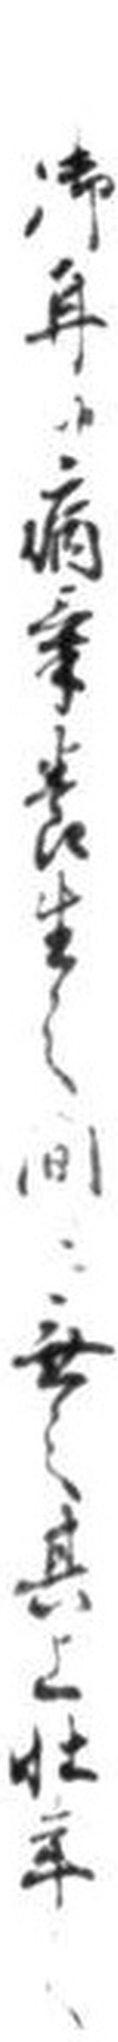御耳候病気養生之間無之其上壮年
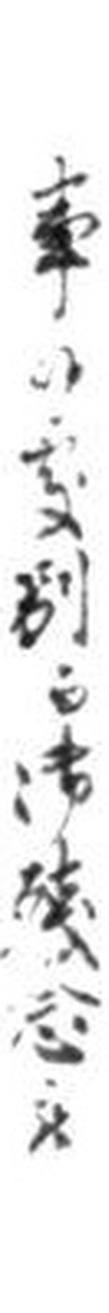事候処別而御残念被
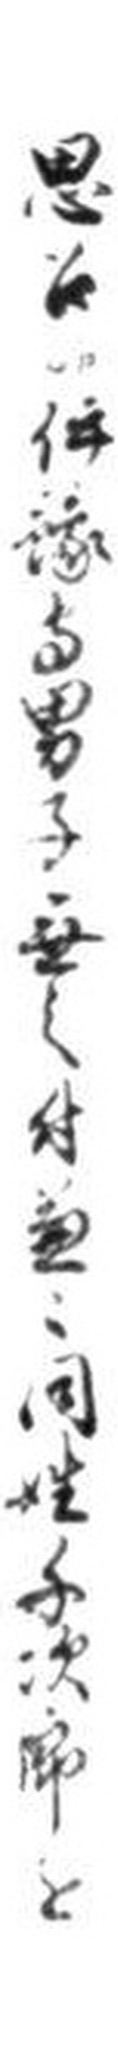思召候伊予守男子無之付兼々同姓千次郎を
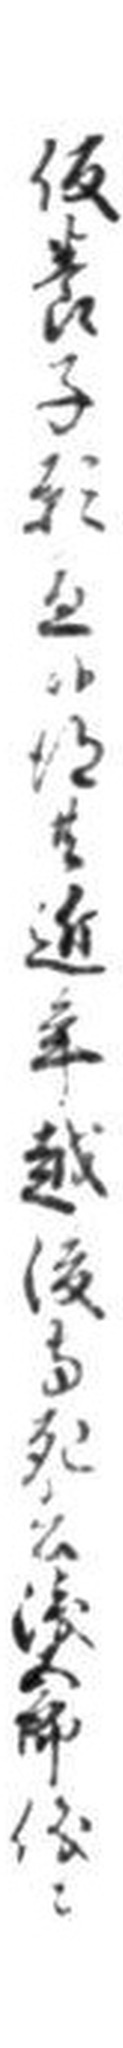仮養子願置候得共近年越後守死去浅五郎儀者
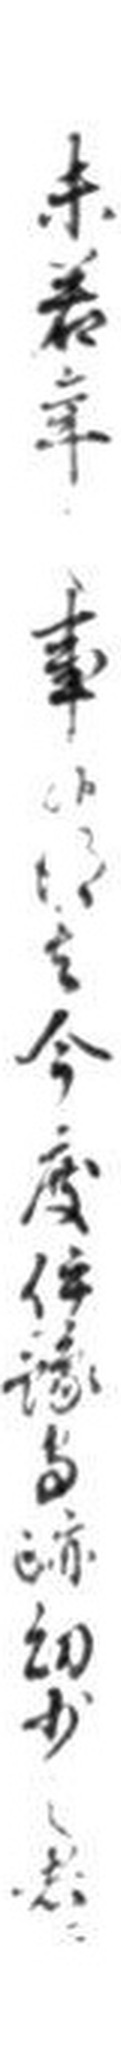未若年之事候得者今度伊予守跡幼少之者ニ
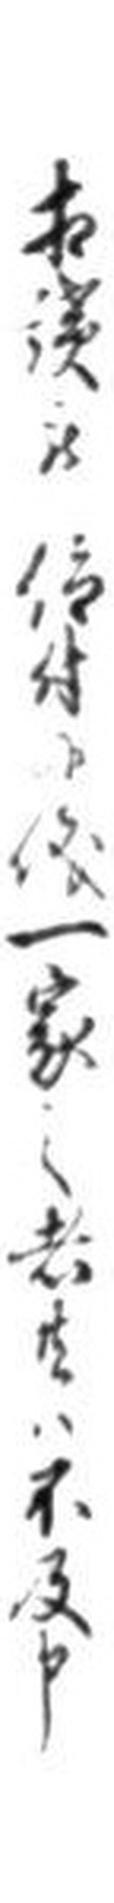相続被仰付候儀一家之者共ハ不及申
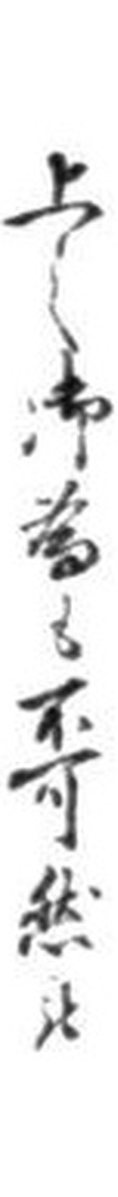上之御為も不可然被
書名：家譜 三十五 宗昌公 従享保六年到同七年
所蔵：福井県文書館 Fukui Prefectural Archives
